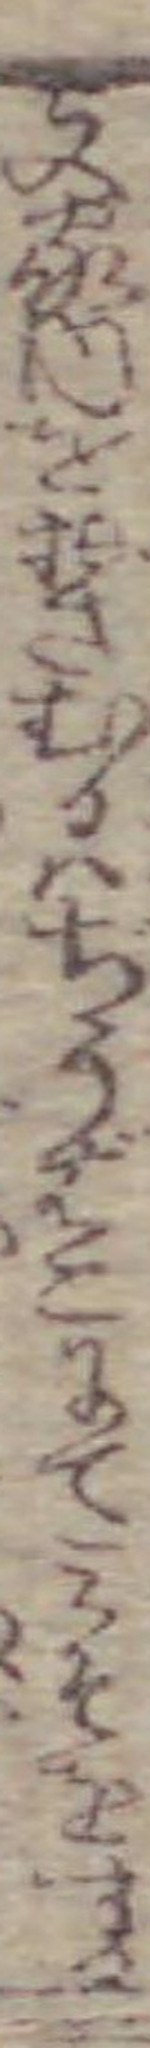又家内をおさむるはぢうばこにてみそをする
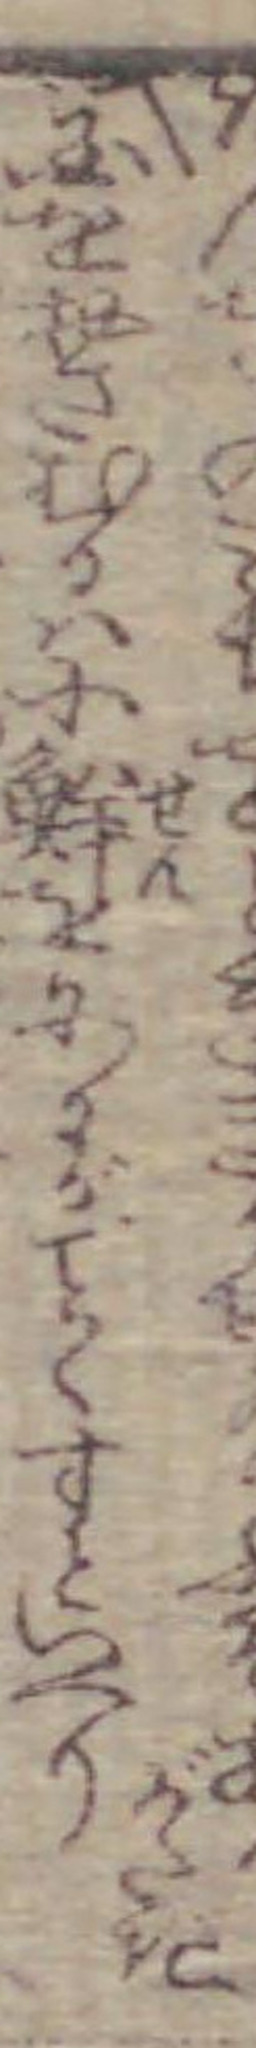〽国をおさむるは小鮮をにるがことくすといへり
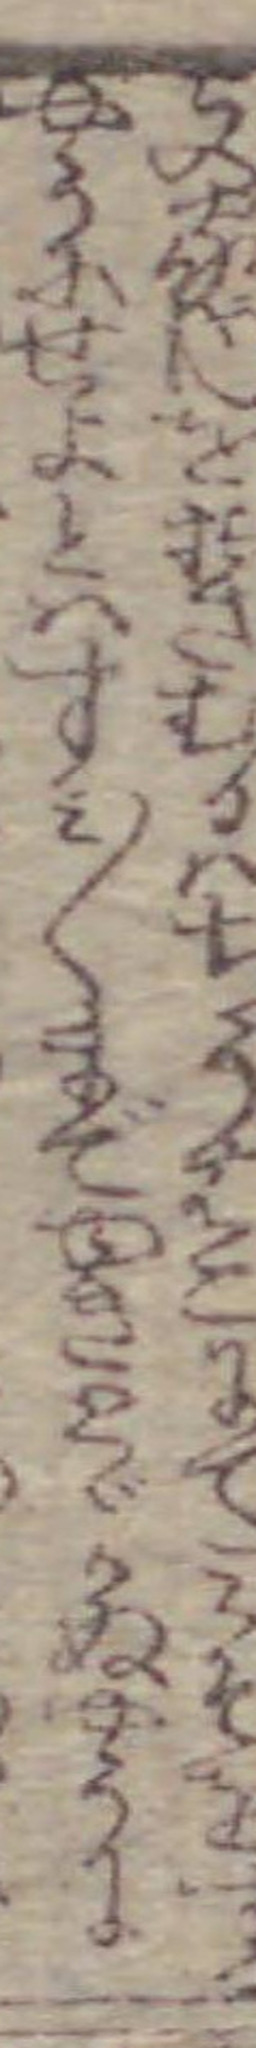やうにせよとはすみ〳〵までゆきとゞかぬやうに
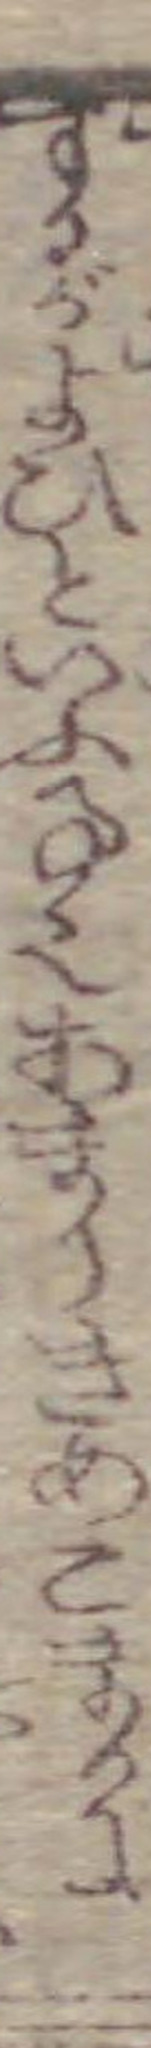するがよひいふ事也あまりきめこまかに
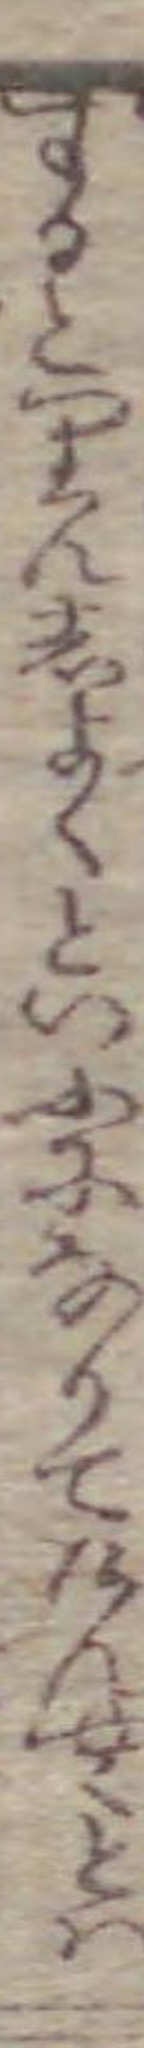するとりんしよくといふになりてけんやくとは
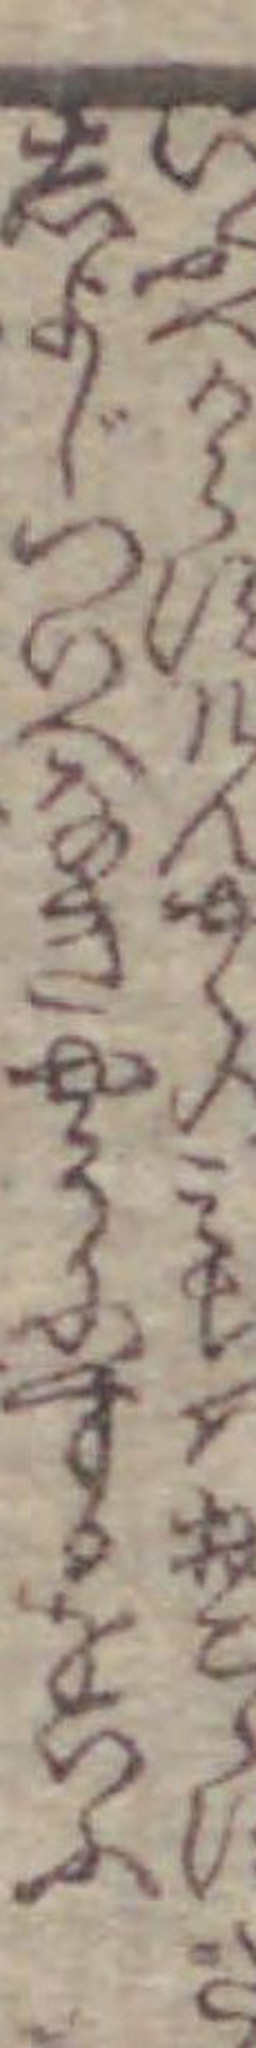しよじついへなきやうにするをいふ
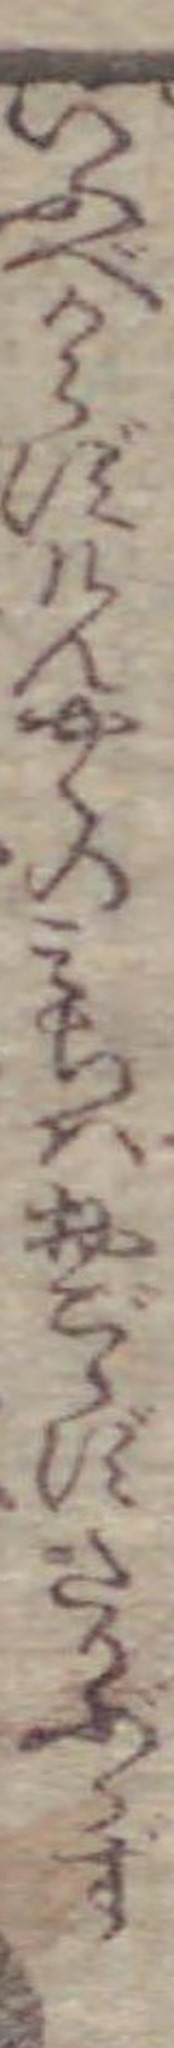いふべからずけんやくのみちはおごらずたかぶらず
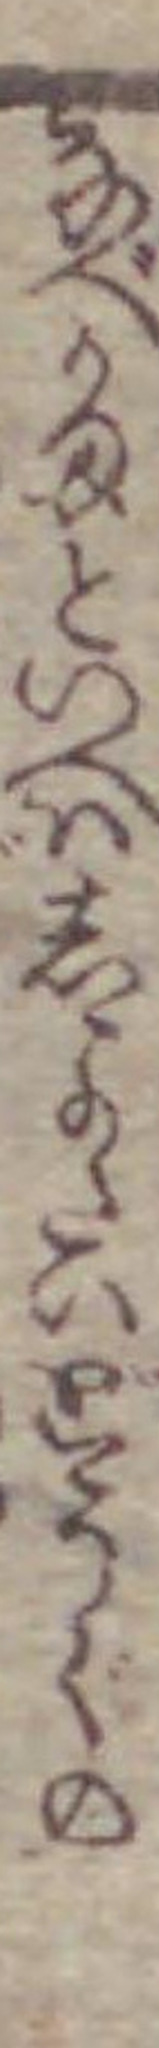なべかまといへはしよたいどうぐの
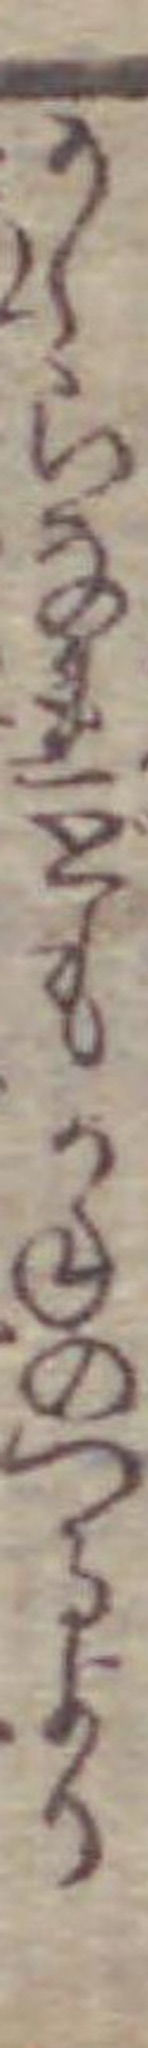かしらなれどもかねのつるより
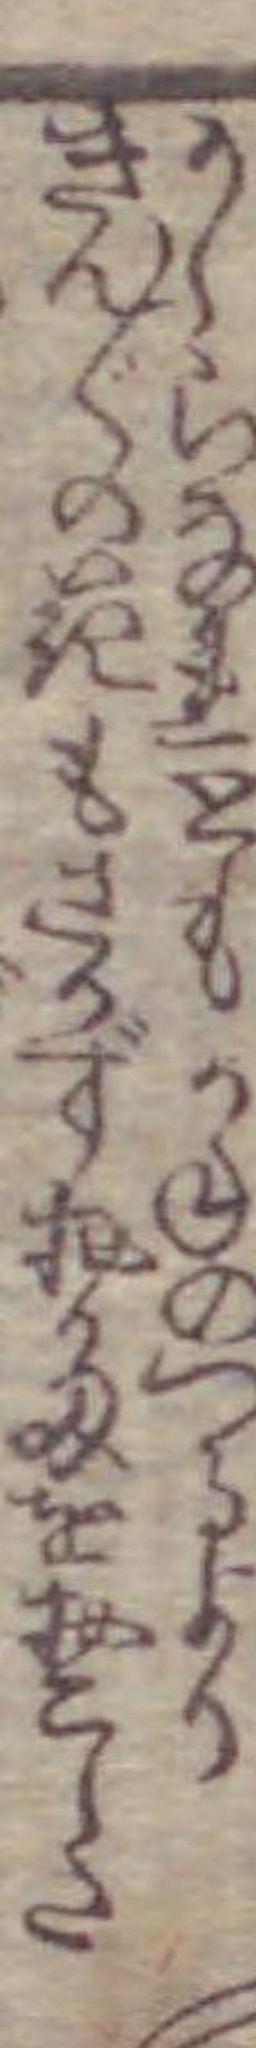きん〴〵の花もさかずおかまをおこした
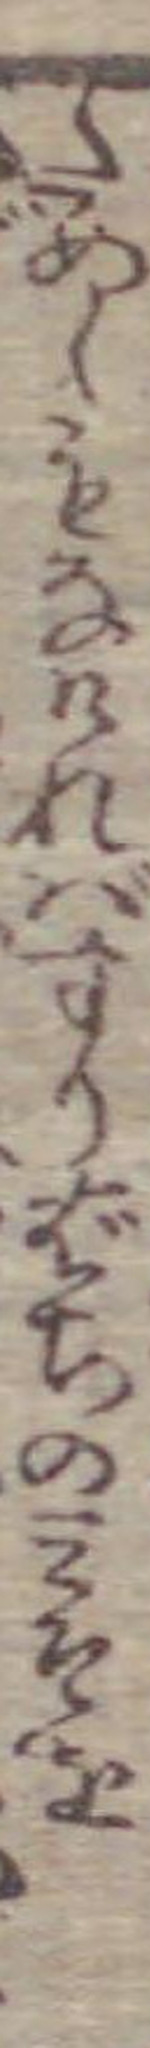ためしもなければすりばちのみそを
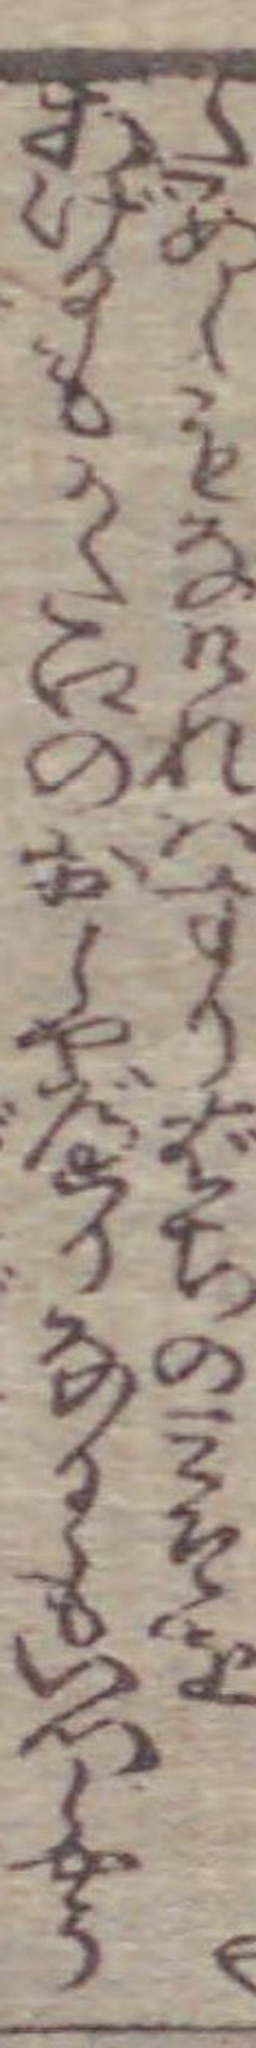あげるもかた口のおしやべりなるもいつしやう
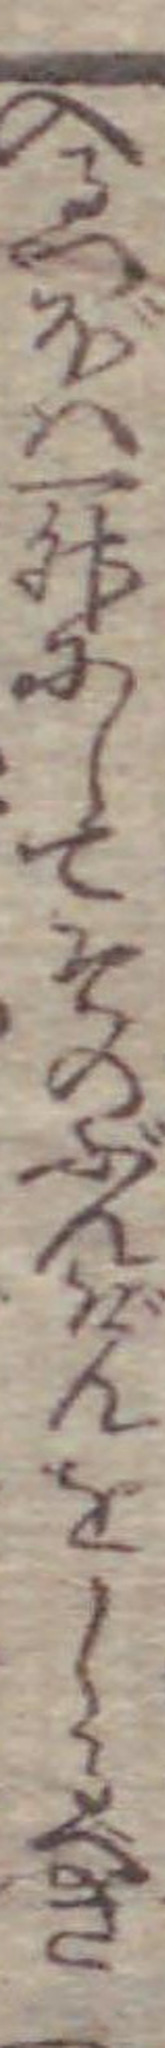入るつぼは一升にしてそのぶんげんをしるべき
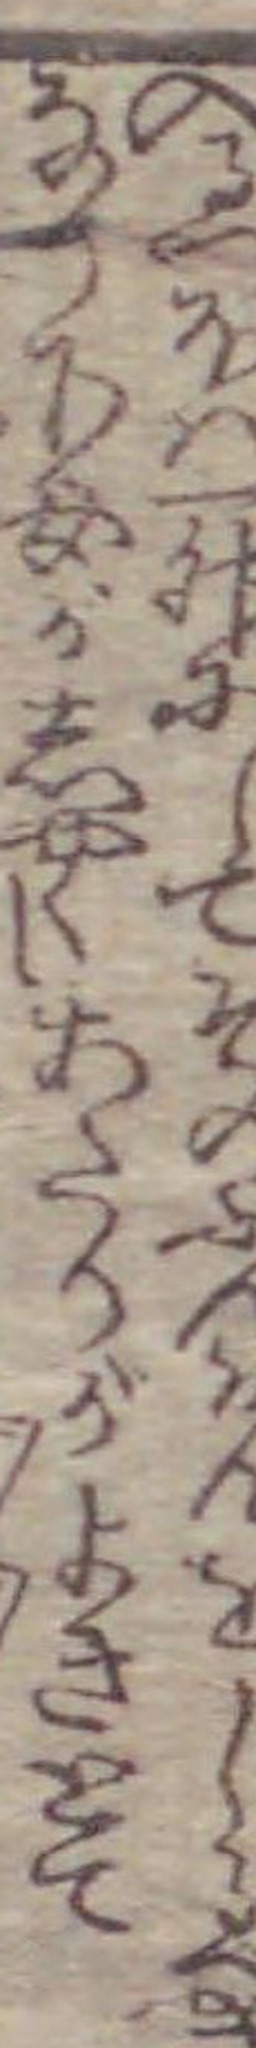なり下女がしやくしあたりがよきとて
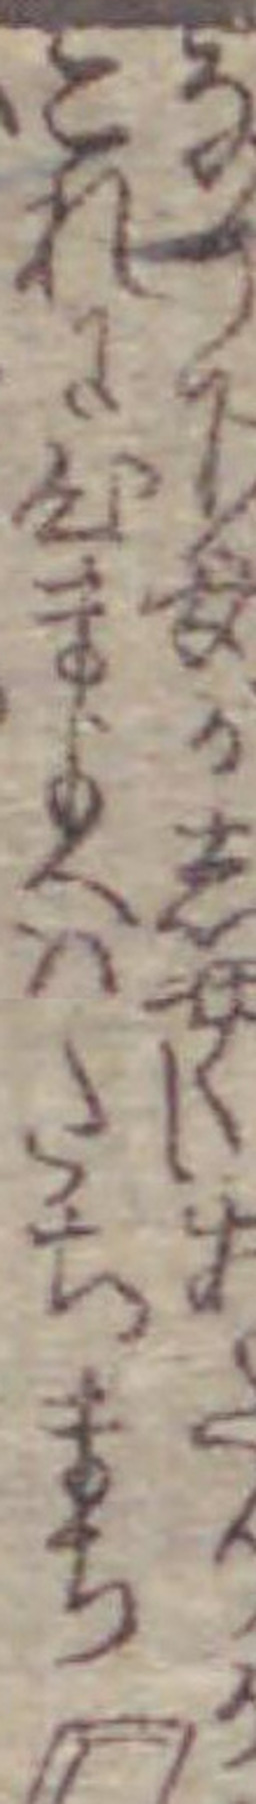これに心まよへはたちまち
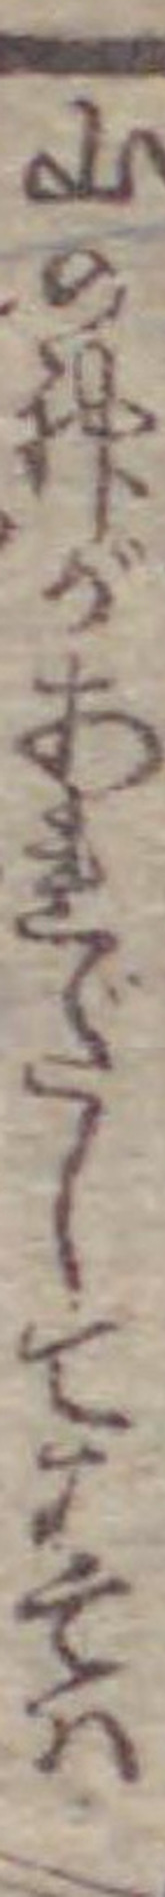山の神があれだしてはては
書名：万物小遣帳 : 2巻
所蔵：国立国会図書館 National Diet Library, JAPAN
